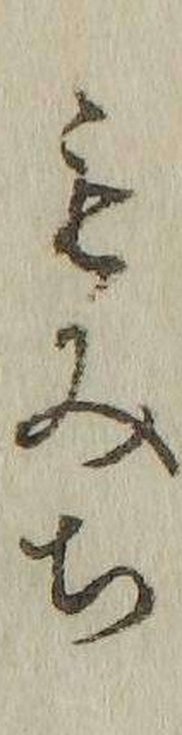もみち

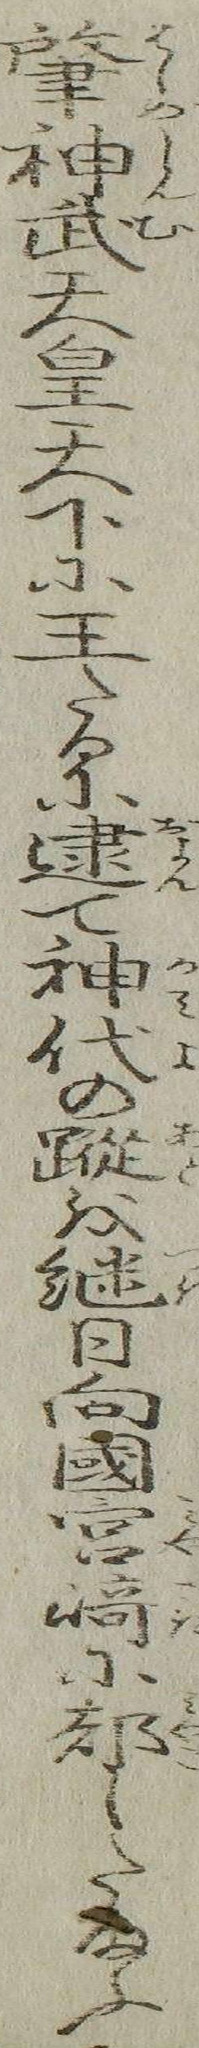肇神武天皇天下に王たるに逮て神代の蹤を継日向國宮﨑に都したまふ
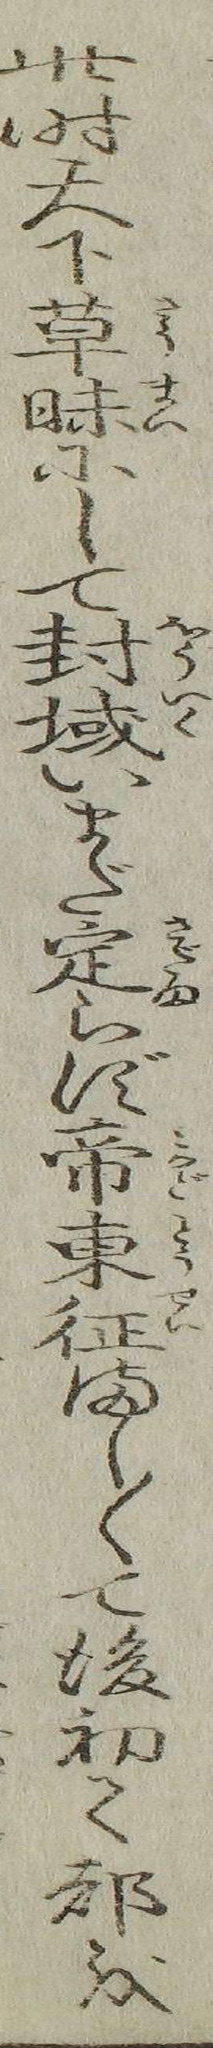此時天下草昧にして封域いまだ定らず帝東征まし〳〵て後初て都を
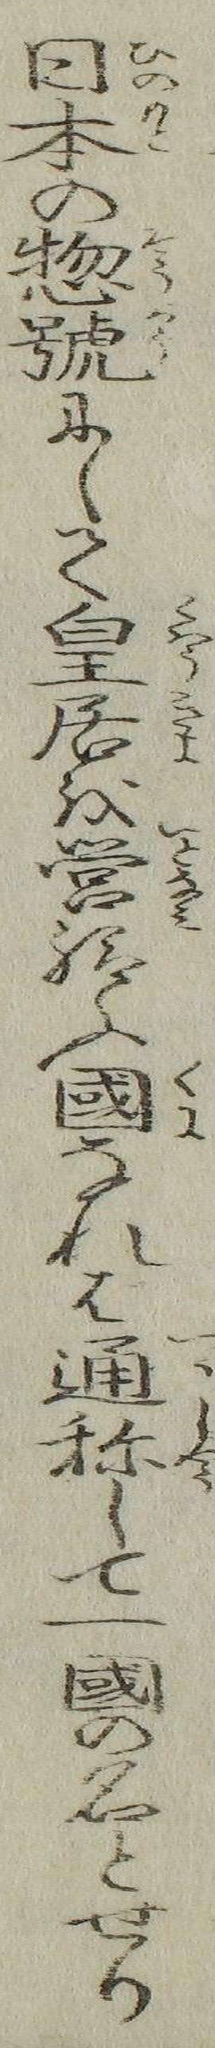日本の惣號にして皇居を営給ふ國なれば通称して一国の名とせり
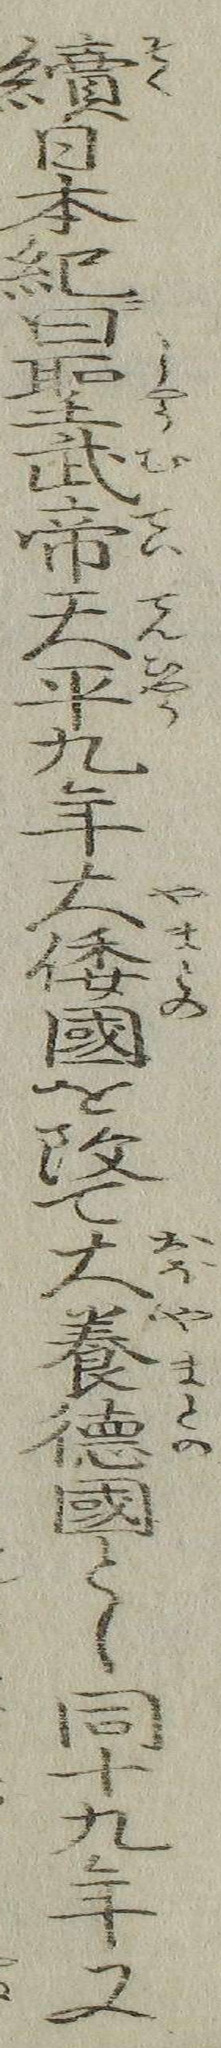続日本紀曰聖武帝天平九年大倭國を𨸩て大養德國とし同十九年又
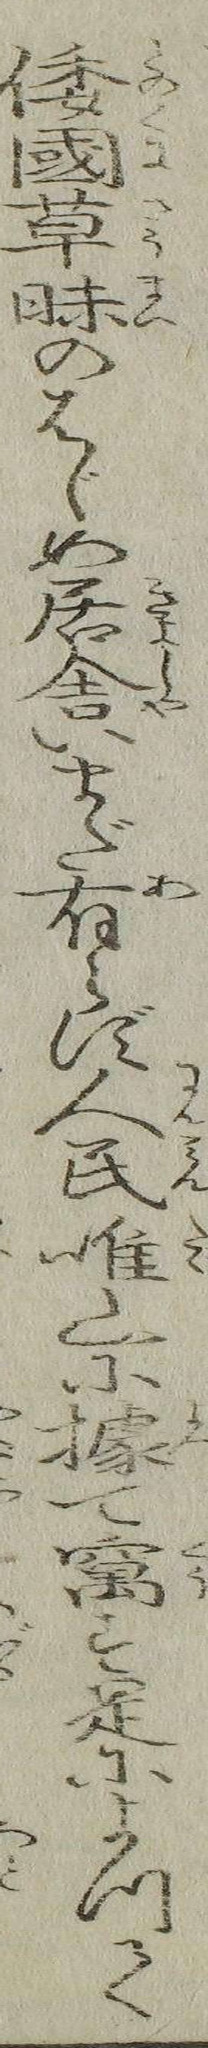倭國草昧のはじめ居舎いまだ有らず人民唯山に據て寓す是によつて
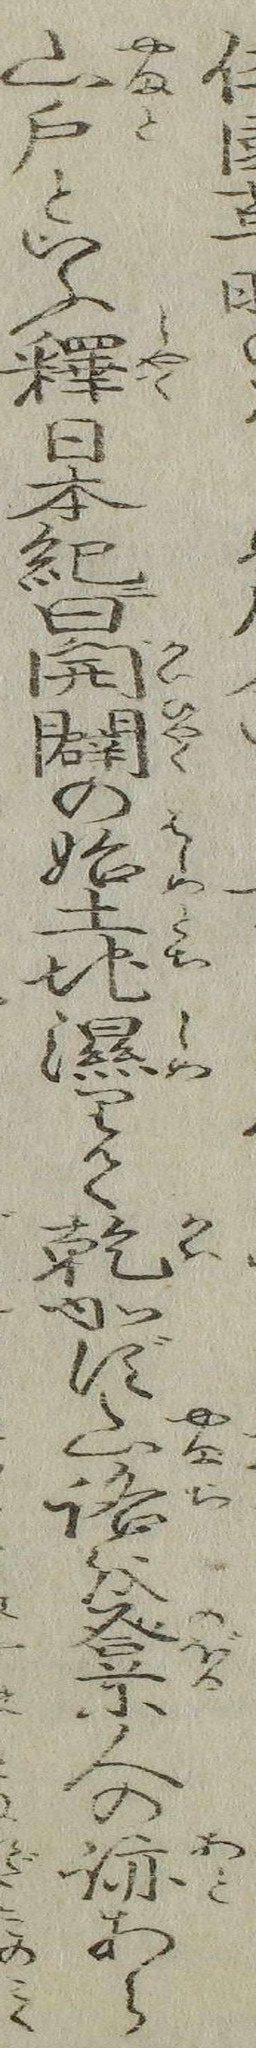山戸といふ釋日本紀曰開闢の始土地濕りて乾かず山路を登に人の跡あら
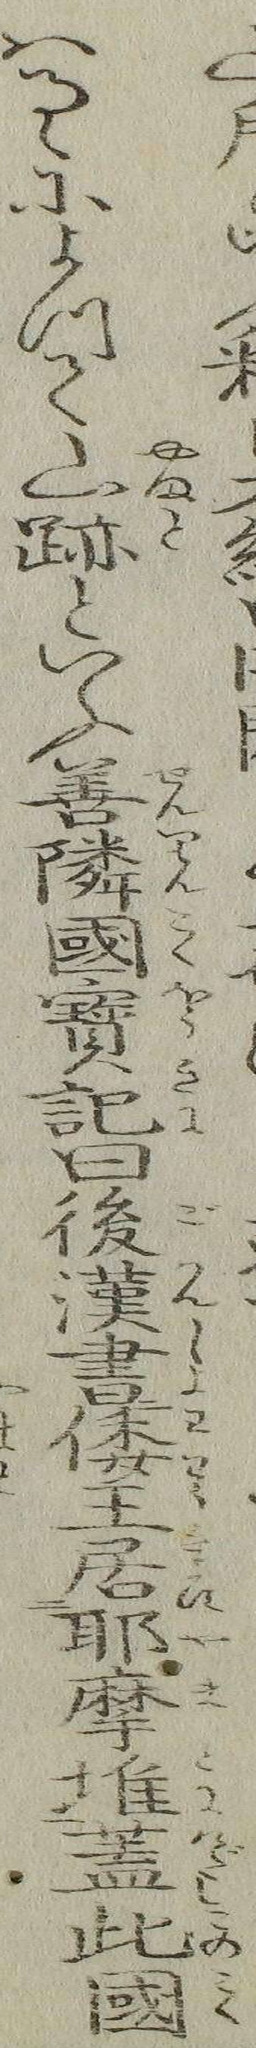はるゝによつて山跡といふ善隣國寳記曰後漢書倭王居耶麻堆蓋此國
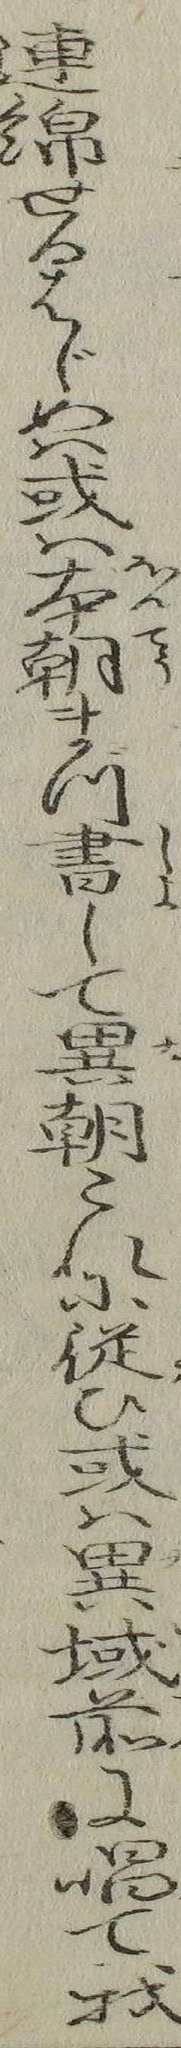連綿せるはじめは或は本朝まづ書して異朝これに従ひ或は異域前に唱て我
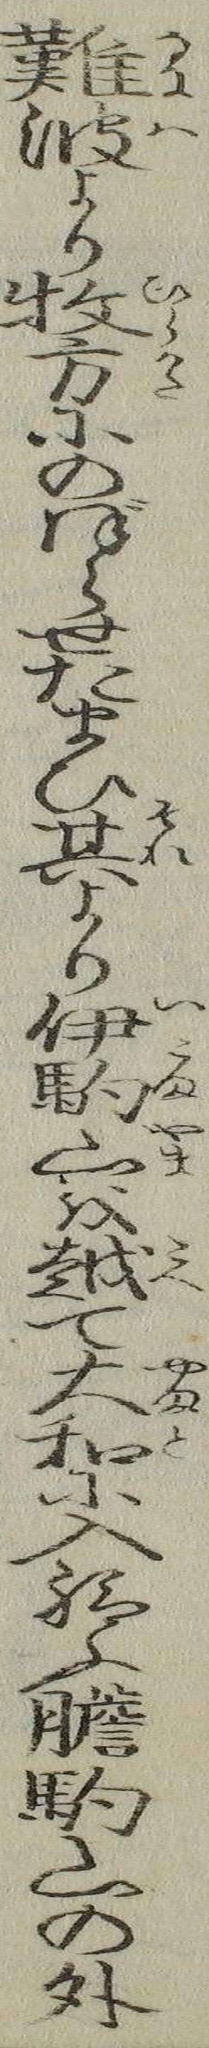難波より牧方にのぼらせたまひ其より伊馰山を越て大和に入給ふ膽馰山の外
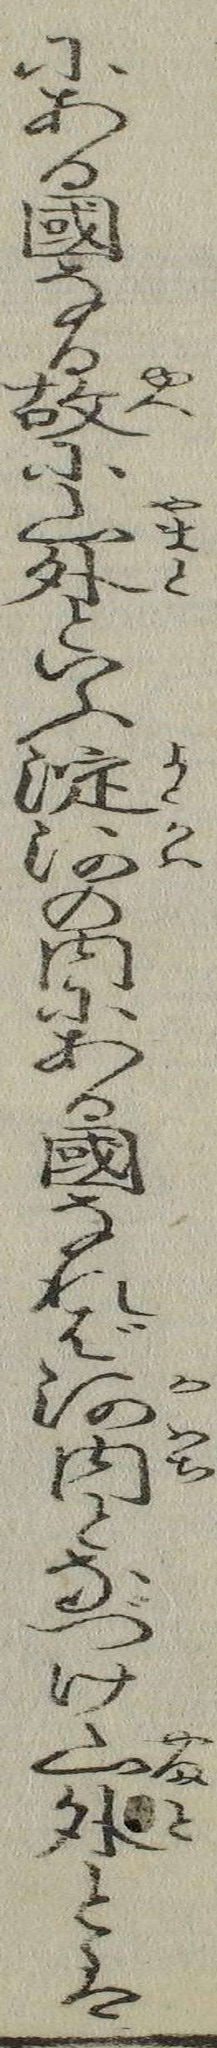にある國なる故に山外といふ淀河の内にある國なれば河内となづけ山外とは
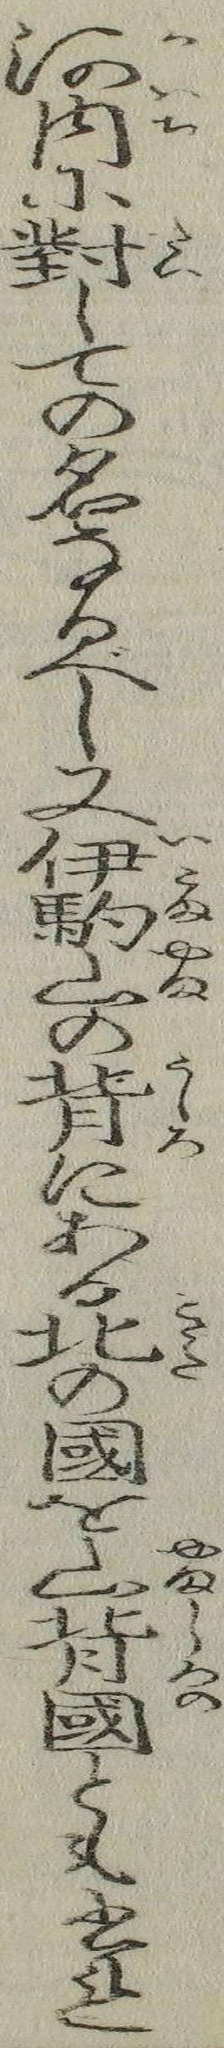河内に對しての名なるべし又伊馰山の背にある北の國を山背國とも書れ
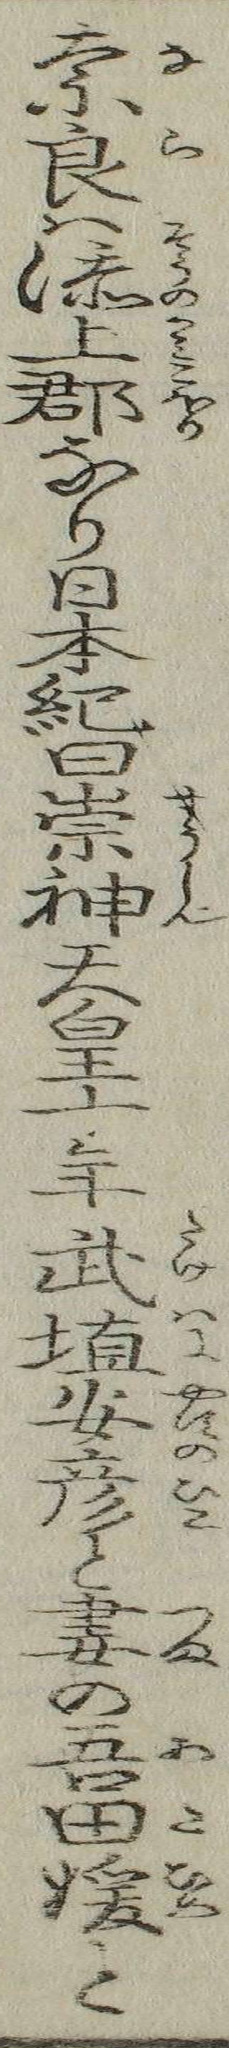奈良は添上郡なり日本紀曰崇神天皇十年武埴安彦と妻の吾田媛と
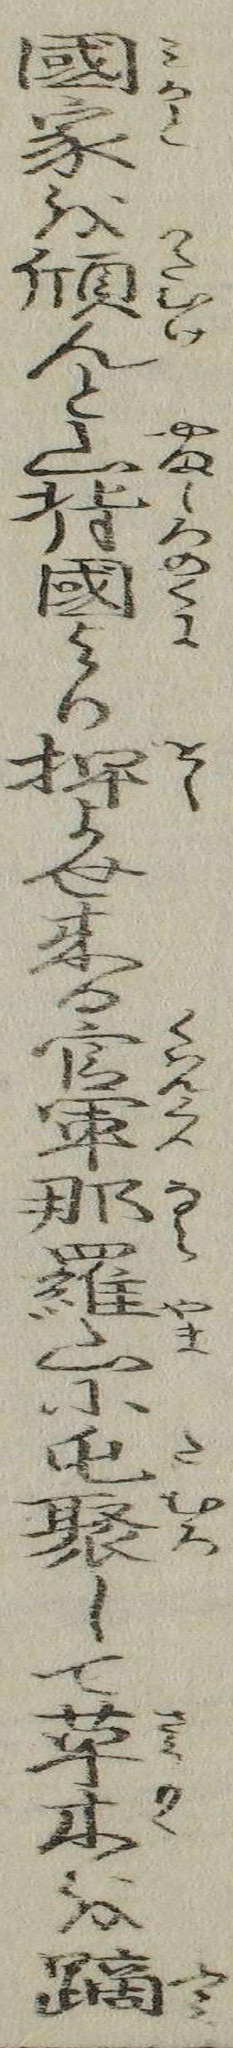國家を頎んと山背國より押よせ来る官軍那羅山に屯聚して草木を蹢
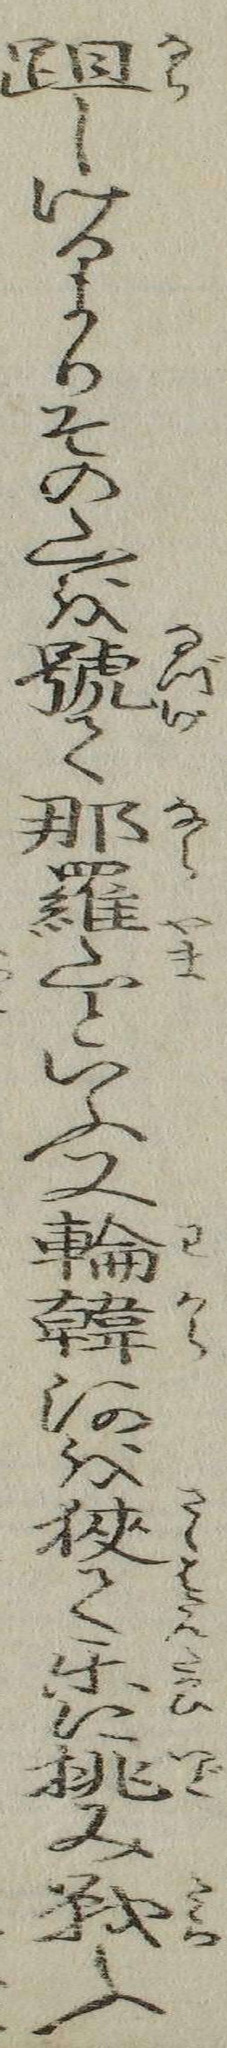跙しけるよりその山を號て那羅山といふ又輪韓河を挾て互に挑み戦ふ
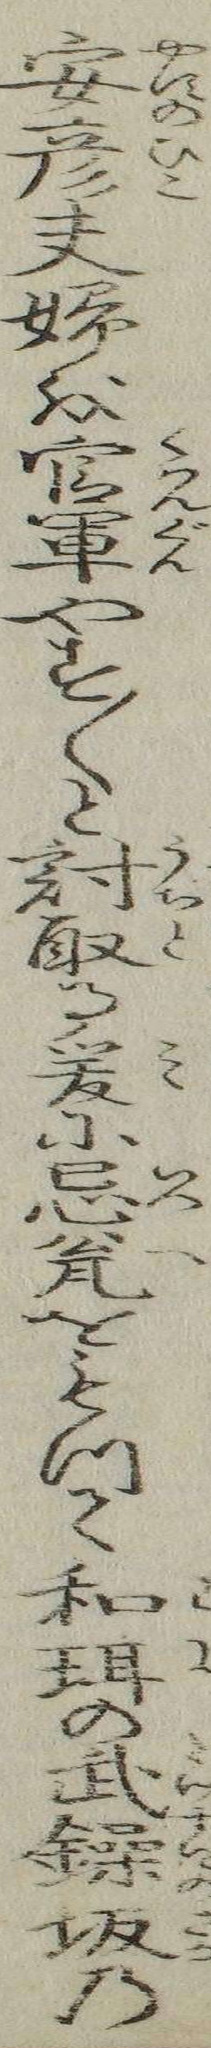安彦夫婦を官軍やす〳〵と討取る爰に忌瓮をもつて和珥の武鐰坂の
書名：大和名所圖會
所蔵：国文学研究資料館
